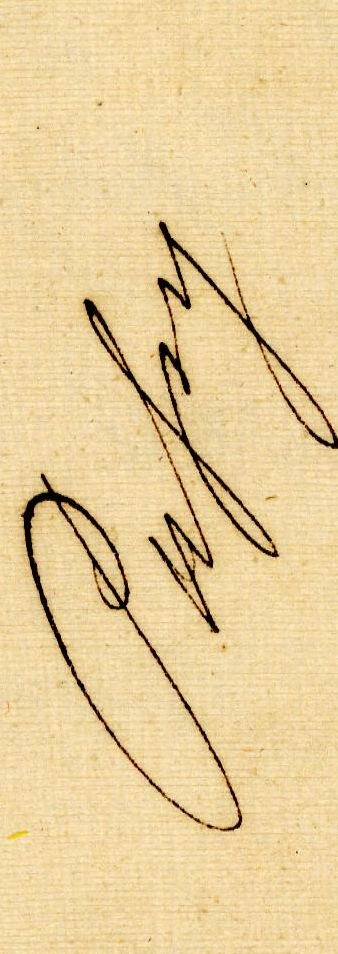Passy
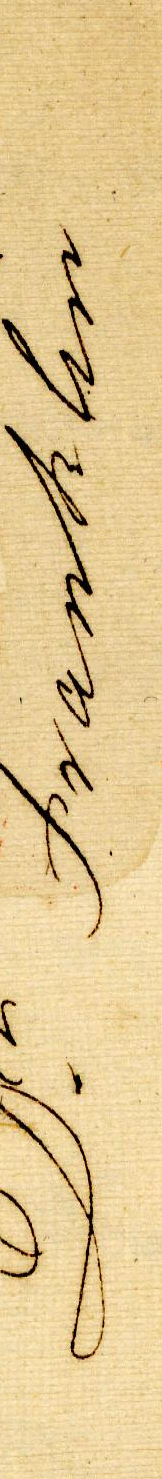D^r. Franklin
